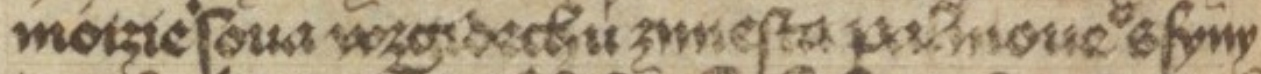moizieẛoua wzgidechu zmieſta palmoue° sſyny
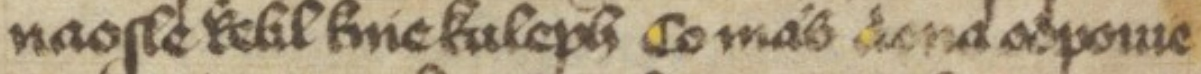naoſle ṙekl kniekaleph Co maṡ dona odpouie
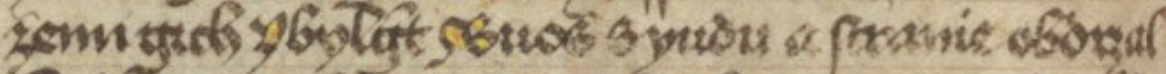zemi gich Ybylg̑t Buos syudu a ſtranie obdrzal
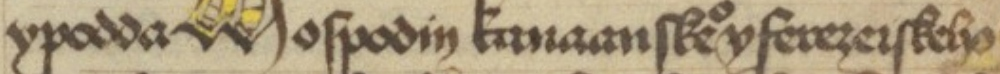ypodda Hoſpodin kanaanſke° yferezeiſkeho
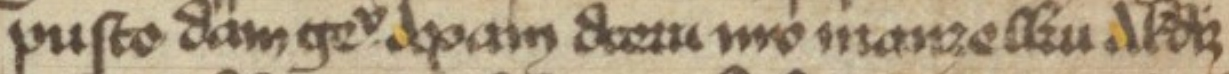puſto dam ge.v Axam dceru mv manzelku Akdiż
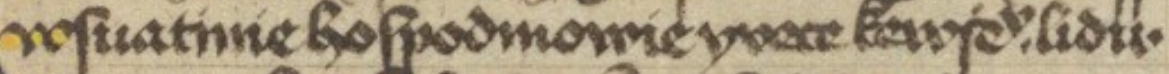Wſuatinie hoſpodinowie yvece kewẛe.v lidu·
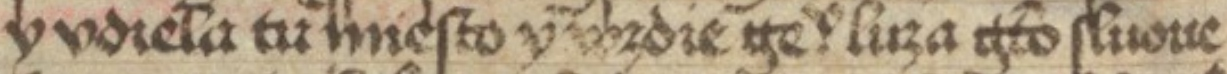y vdiela tu mieſto y wzdie ge.v luza g̑to ſluoue
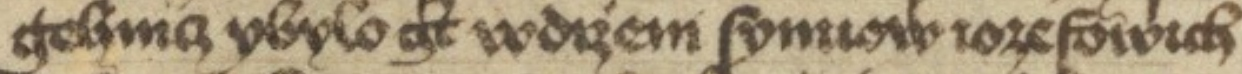gehnicz ybylo g̑t wdrżeni ſynuow iozefowich
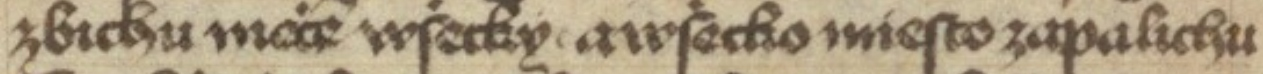zbichu meċȇ wẛecky a wẛecko mieſto zapalichu
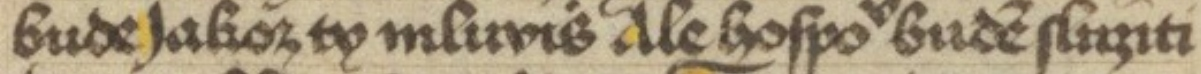bude Jakoz ty mluwiṡ Ale hoſpov budē ſluziti
